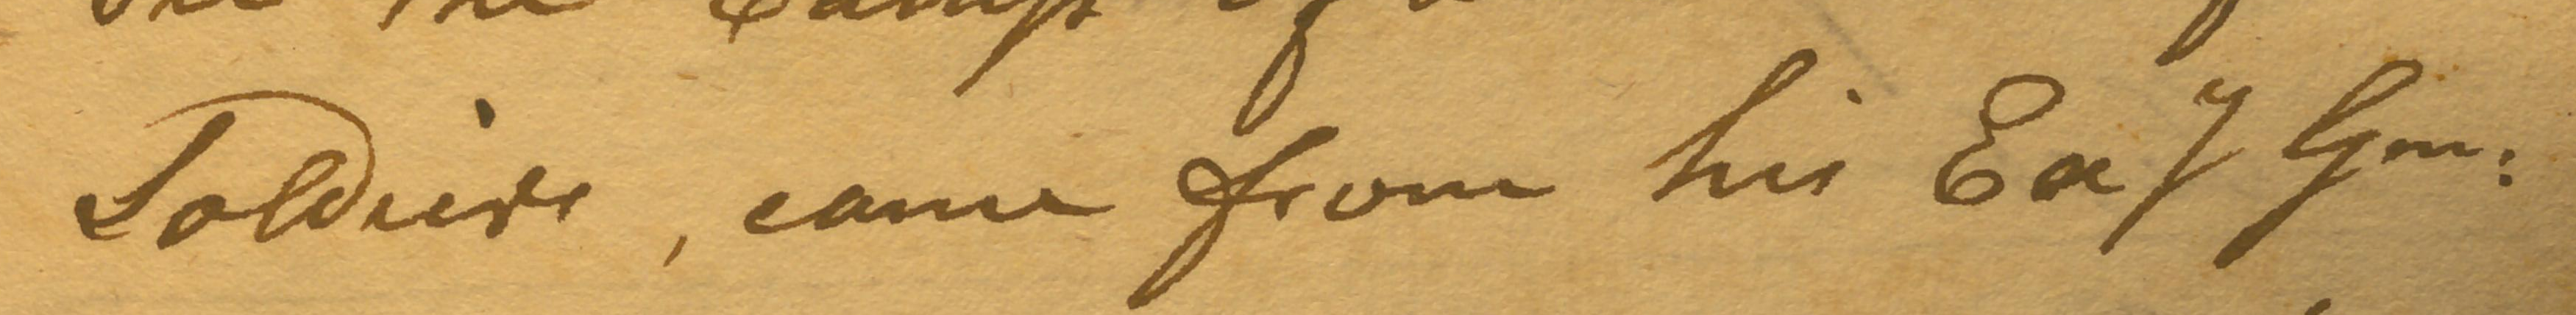Soldiers came from his Ex^y Gen:
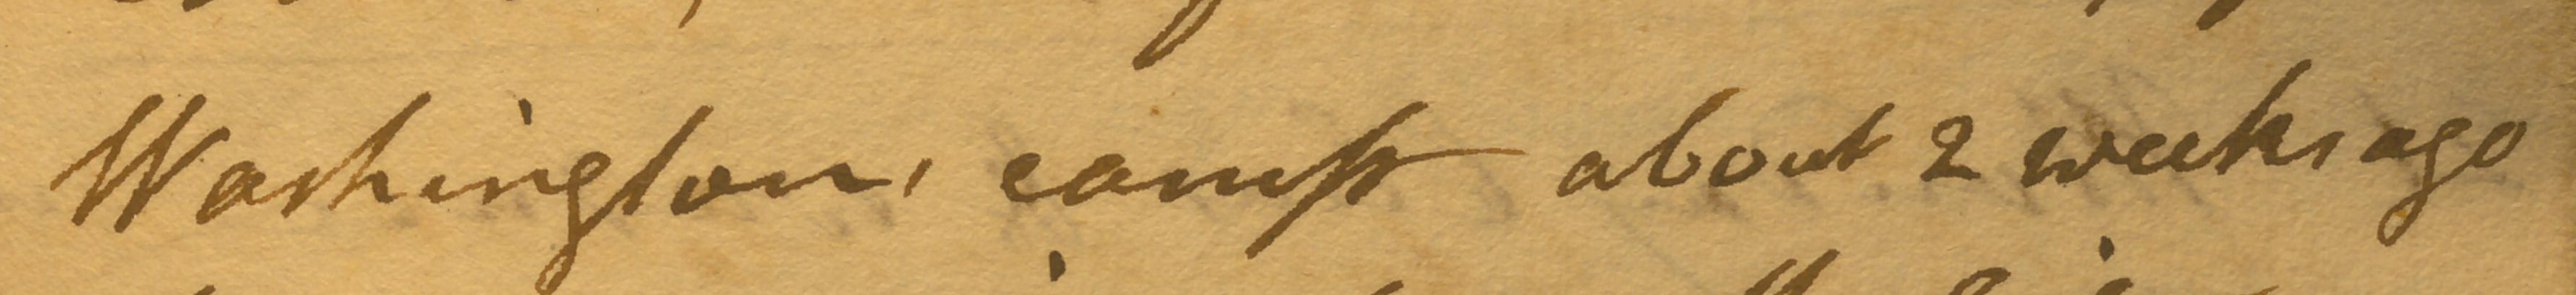Washingtons camp about 2 weeks ago
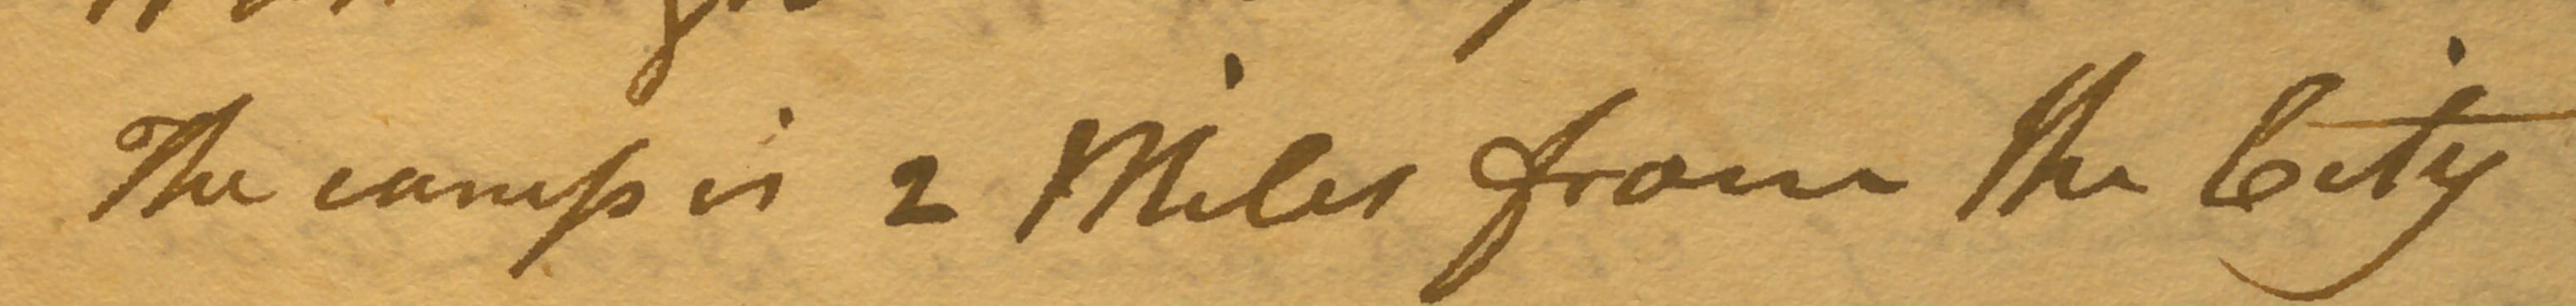The camp is 2 Miles from the City
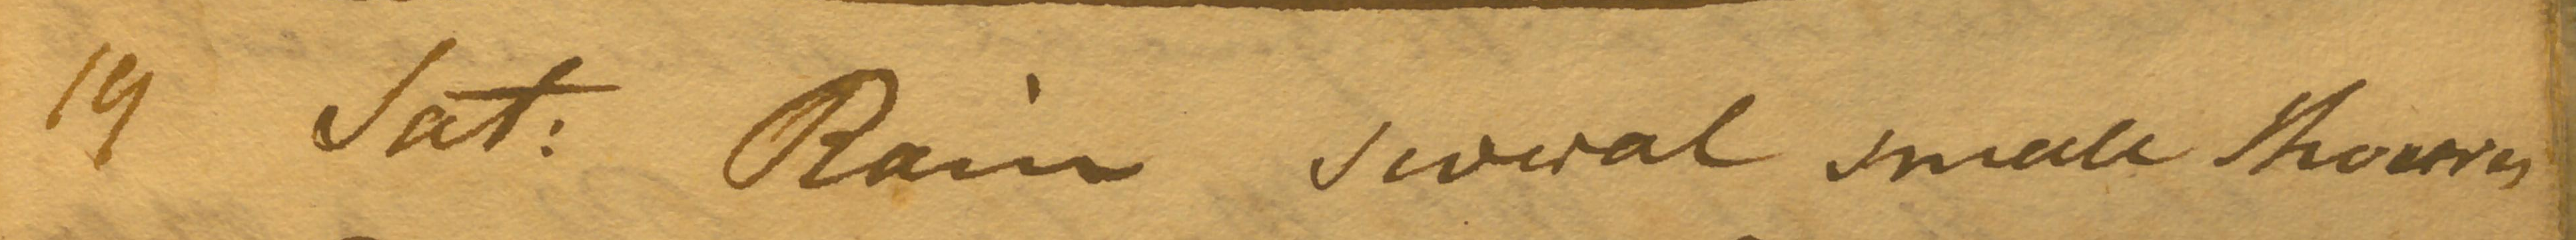19 Sat: Rain several small shoures
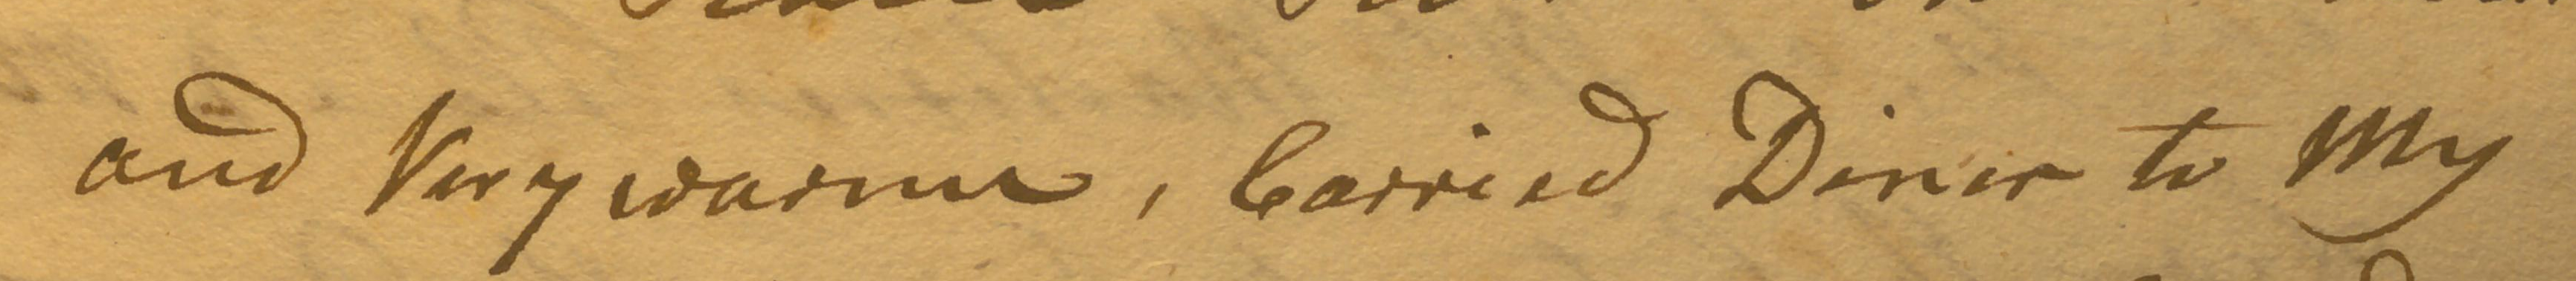and Very warme, Carried Diner to My
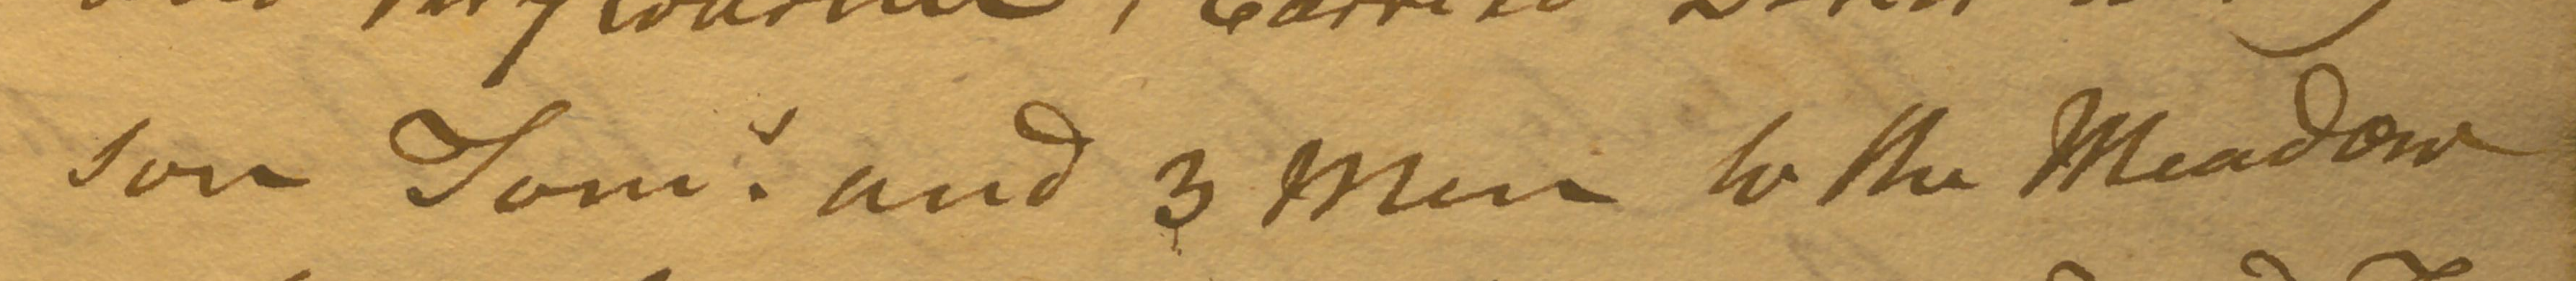Son Tom^s. and 3 Men to the Meadow
